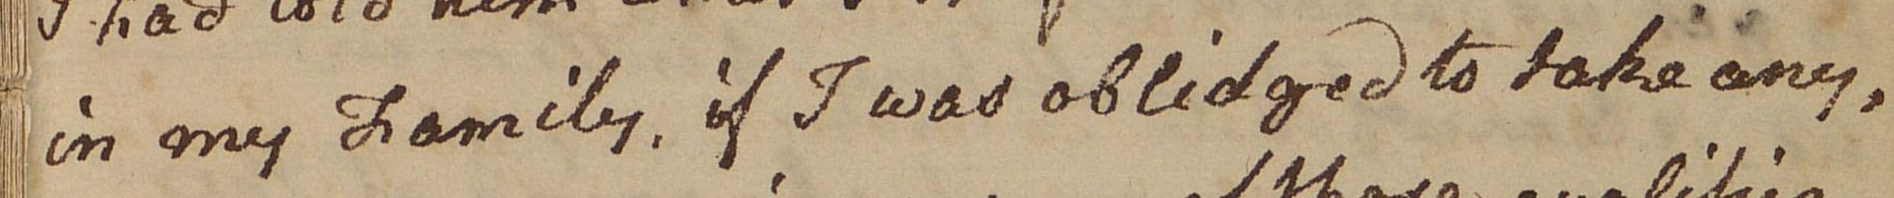in my Family, if I was oblidged to take any,
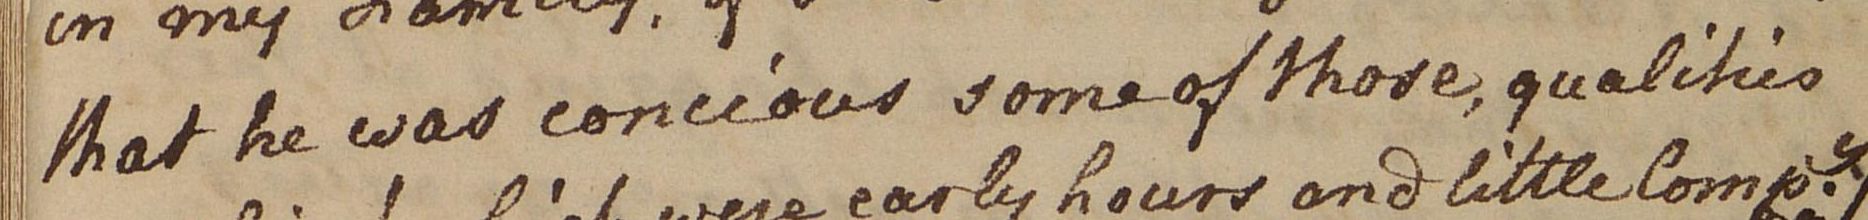that he was concious some of those, qualities
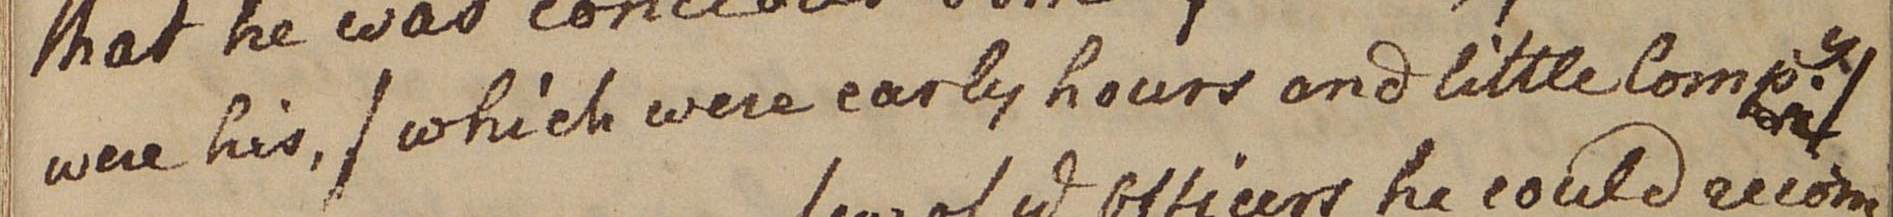were his, /which were early hours and little Comp^y./
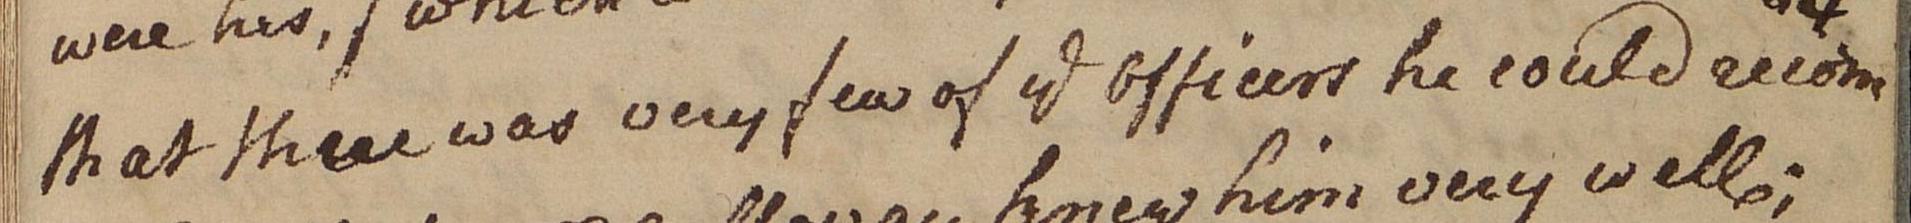that there was very few of y^e Officers he could recom
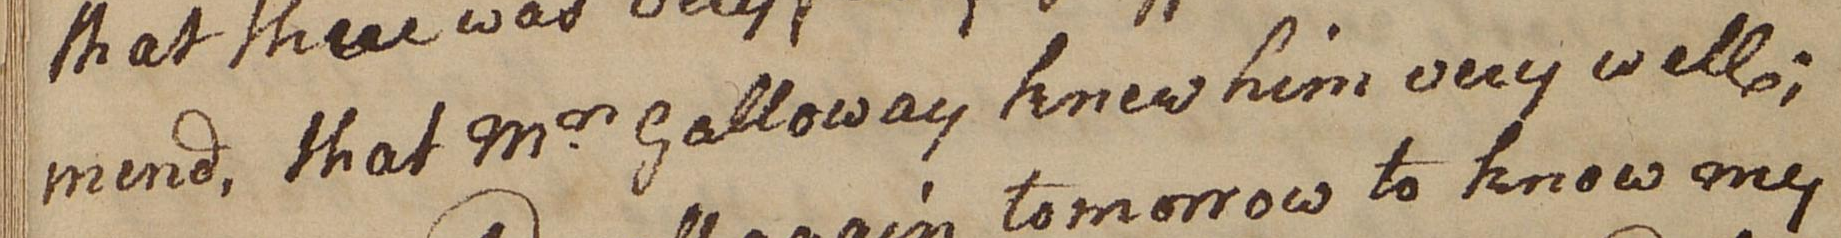mend, that M^r. Galloway knew him very well;
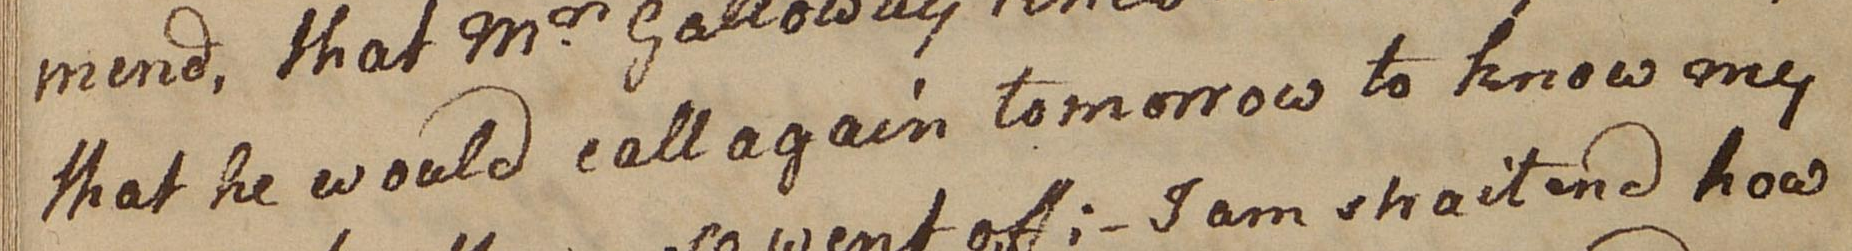that he would call again tomorrow to know my
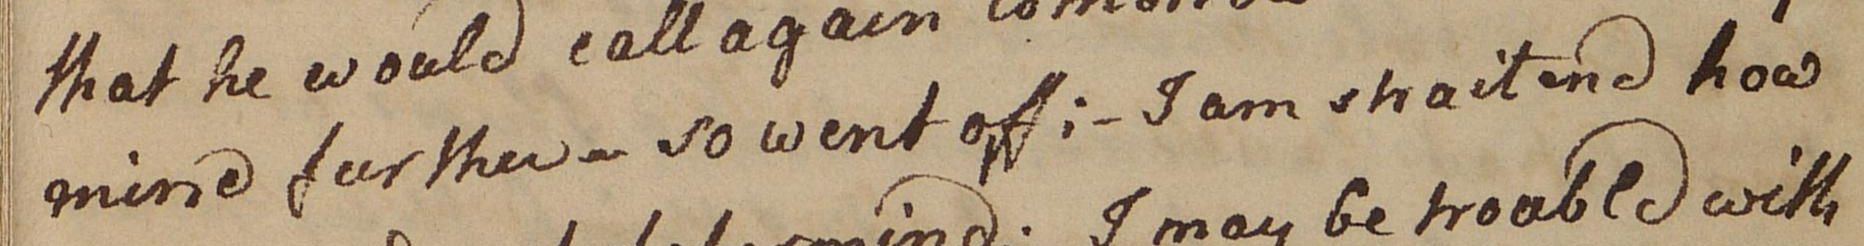mind further- so went off;- I am straitend how
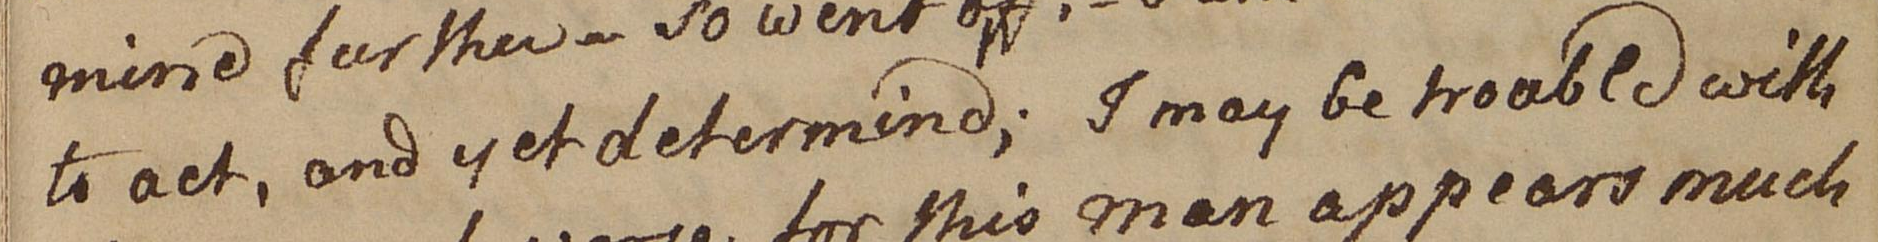to act, and yet determind; I may be troabld with
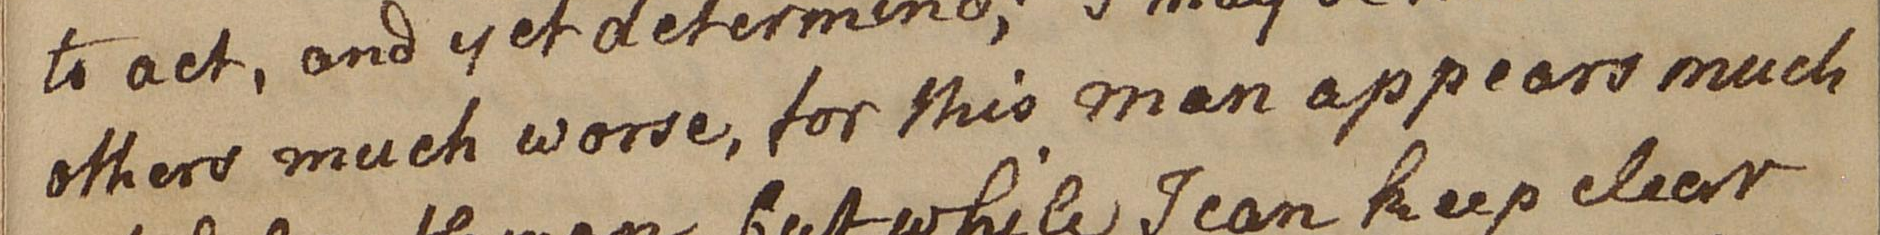others much worse, for this man appears much
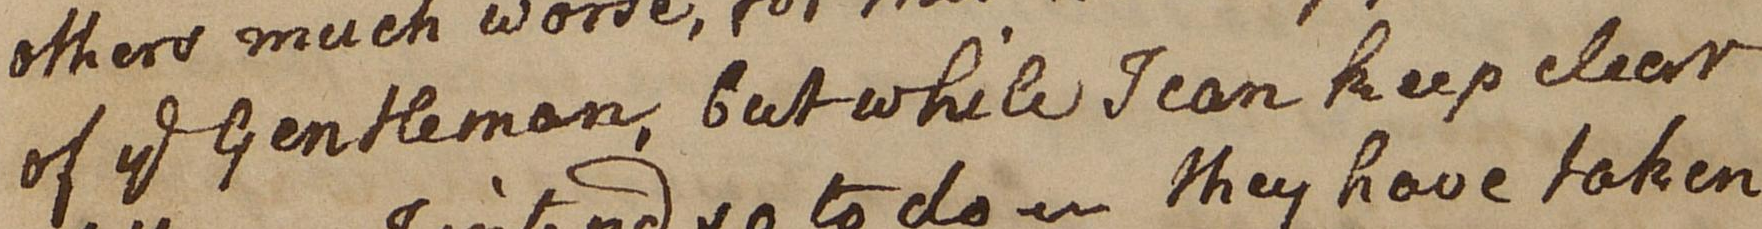of y^e Gentleman, butt while I can keep clear
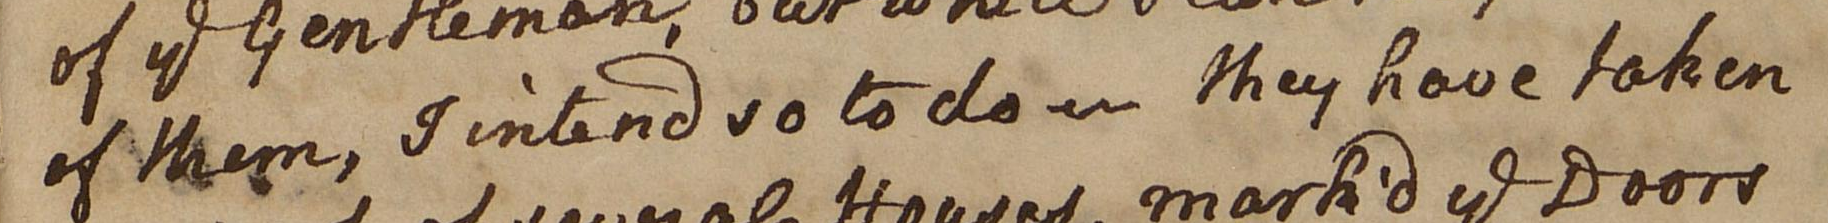if them, I intend so to do- they have taken
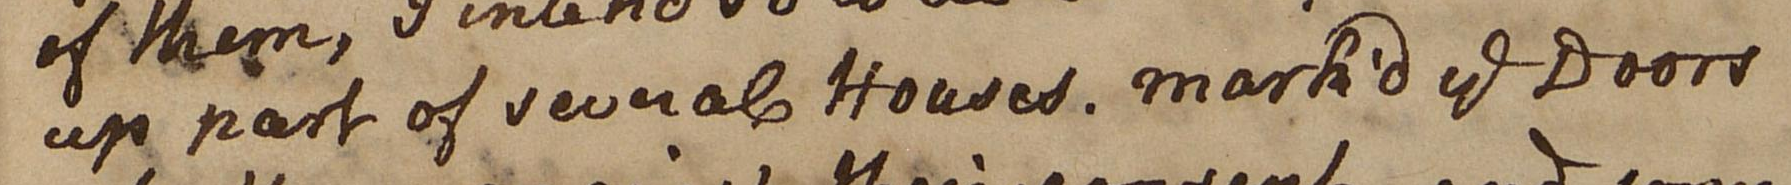up part of several Houses. mark'd y^e Doors
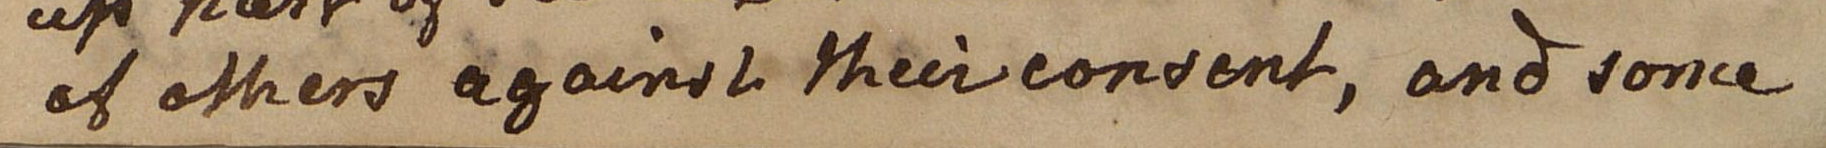of others against their consent, and some
